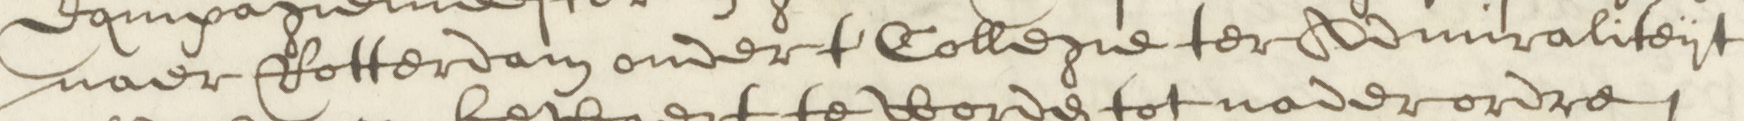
naer Rotterdam onder t'Collegie ter Admiraliteijt
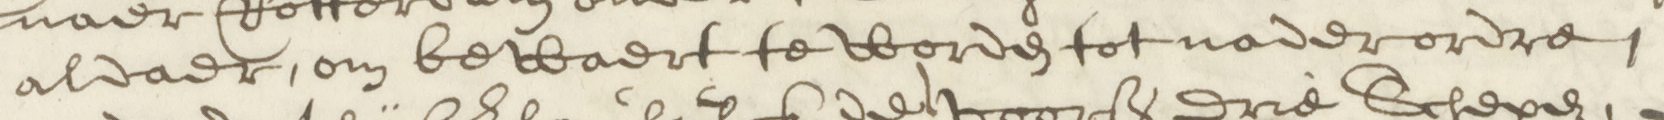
aldaer, om bewaert te worden tot nader ordre
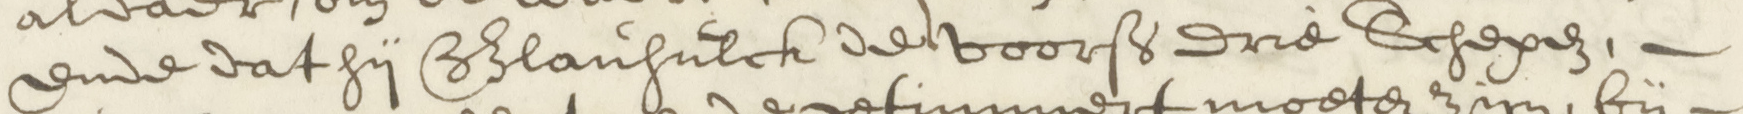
ende dat hij Blauhulck de voorsz drie Schepen —
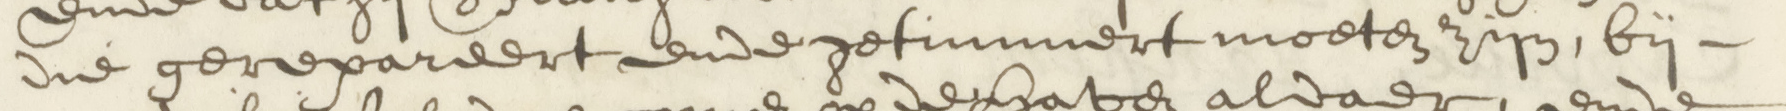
die gerepareert ende getimmert moeten zijn, bij -
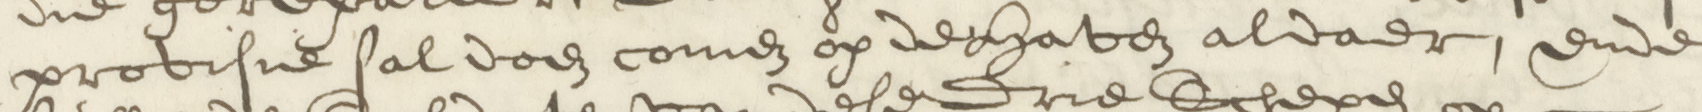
provisie sal doen comen op de haven aldaer, ende
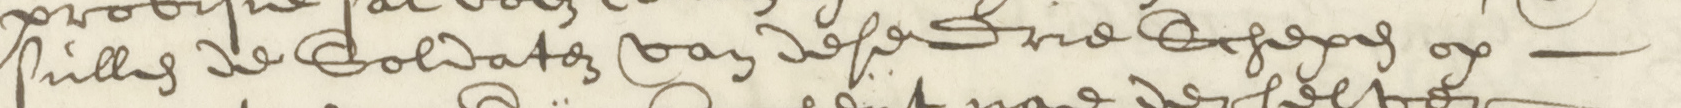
sullen de Soldaten van dese drie Schepen op —
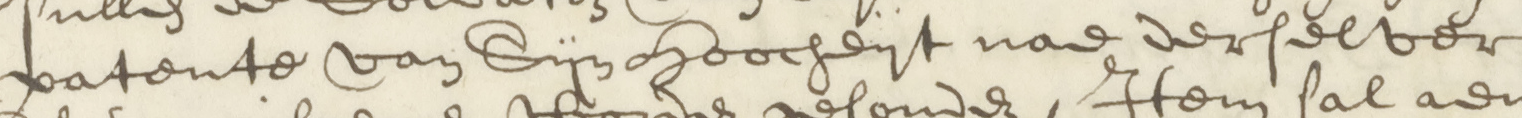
patente van Sijn Hoocheijt nae derselver
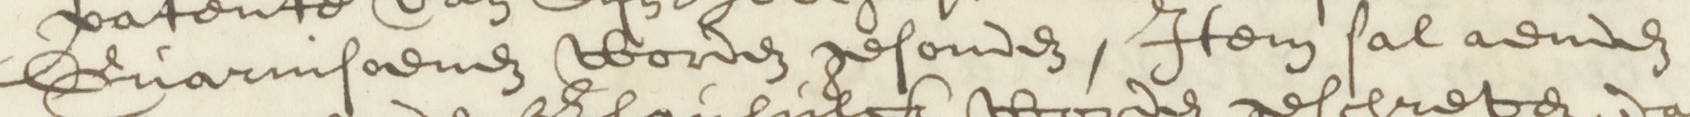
Guarnisoenen worden gesonden. Item sal aenden
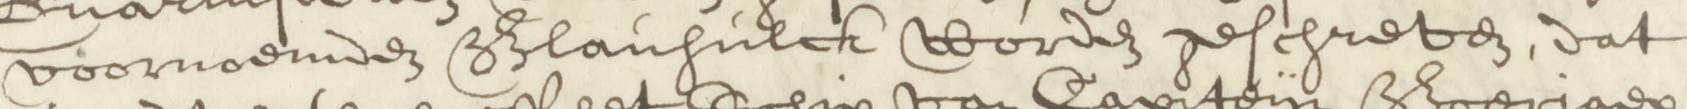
voornoemden Blauhulck worden geschreven, dat
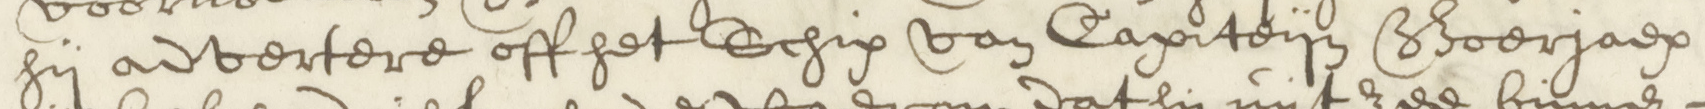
hij advertere off het Schip van Capiteijn Boerjaep
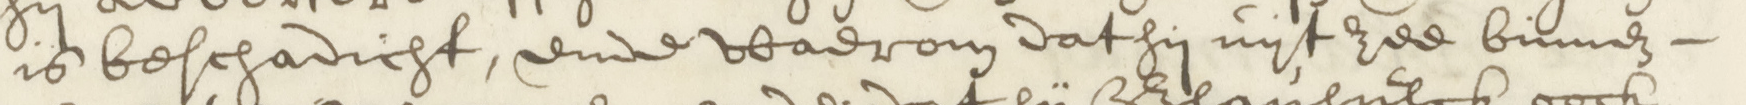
is beschadicht, ende waerom dat hij uijt zee binnen
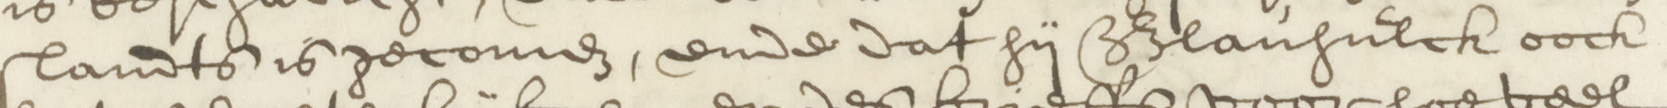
slandts is gecomen, ende dat hij Blauhulck oock
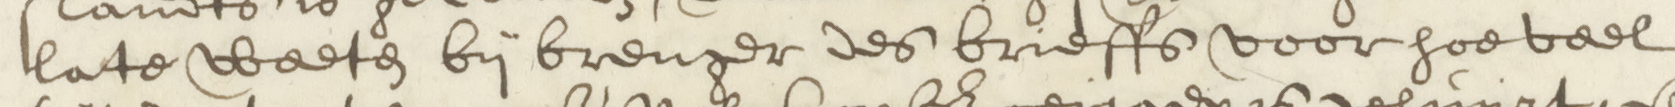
late weeten bij brenger des brieffs voor soeveel
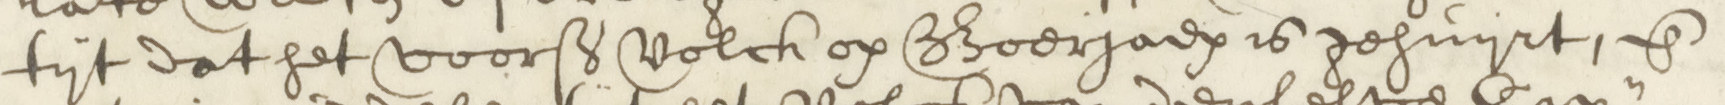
tijt dat het voorsz volck op Boerjaep is gehuijrt, &
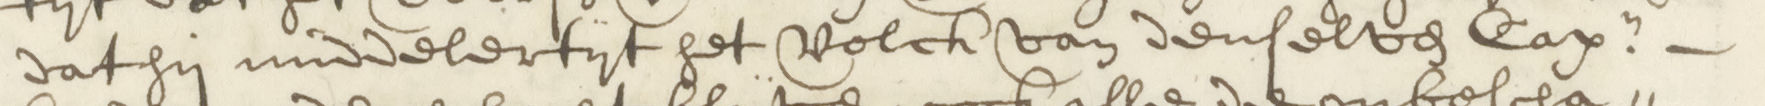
dat hij middelertijt het volck van denselven Capn —
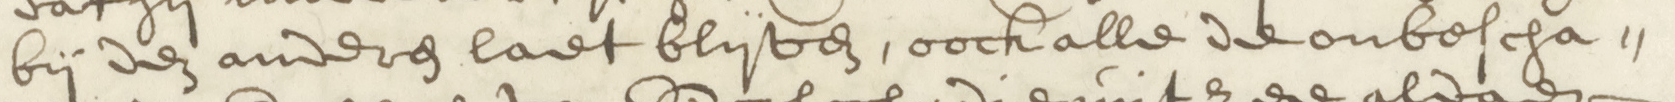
bij den anderen laet blijven, oock alle de onbescha„
